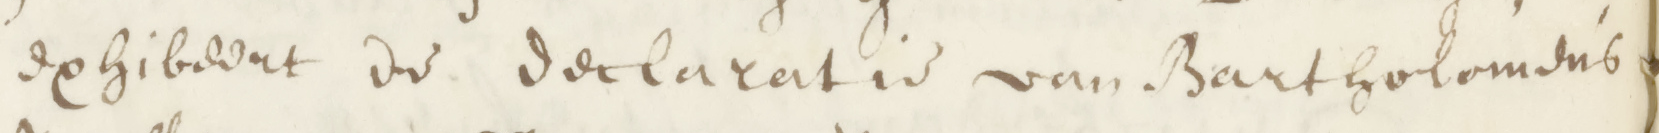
exhibeert de declaratie van Bartholomeus
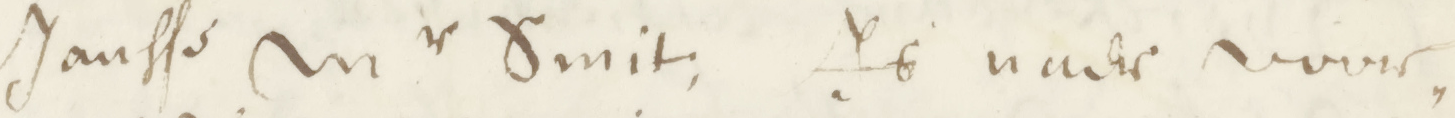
Jansse mr Smit; Is naer voor„
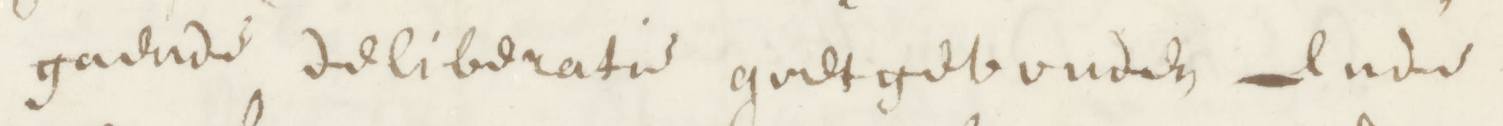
gaende deliberatie goetgevonden ende
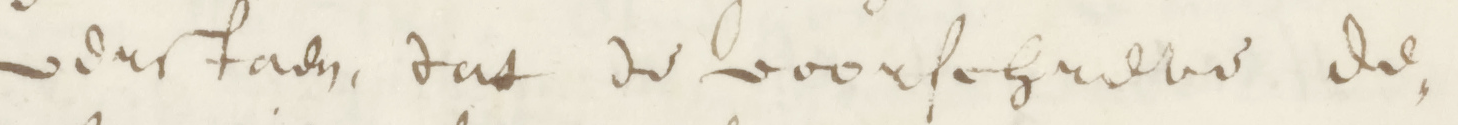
verstaen, dat de voorschreve de„
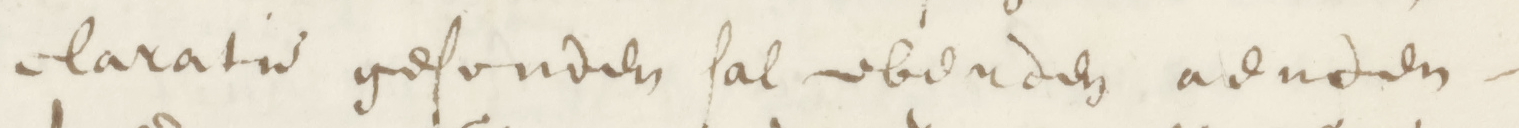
claratie gesonden sal werden aenden
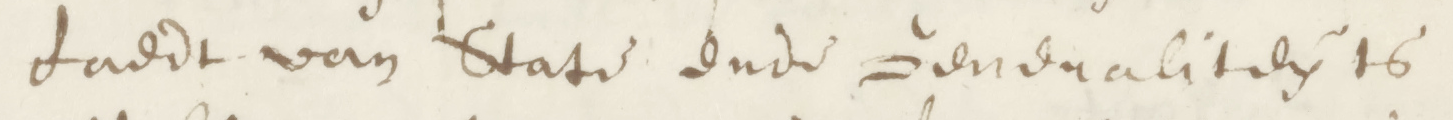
Raedt van State ende Generaliteijts
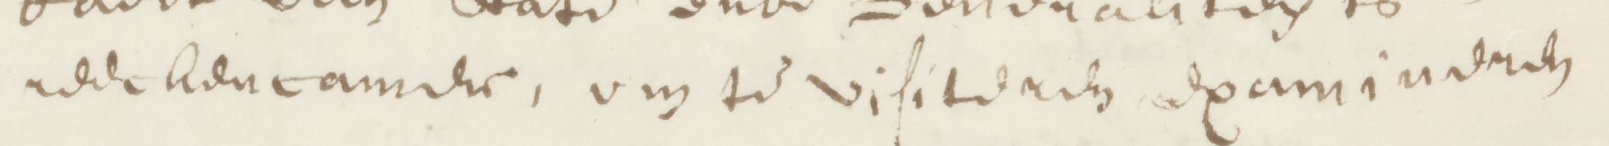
reeckencamer, om te visitereen examineren
